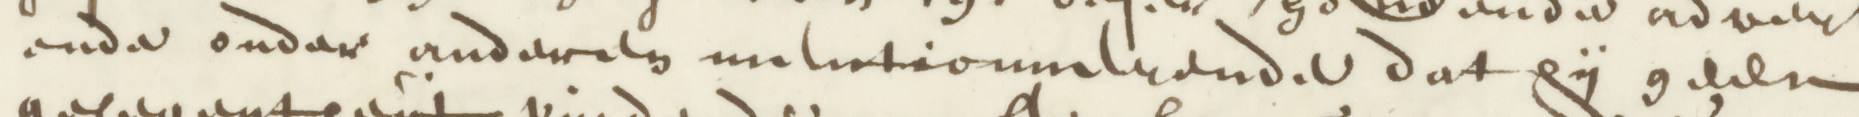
ende onder anderen mentionnerende dat hij geen
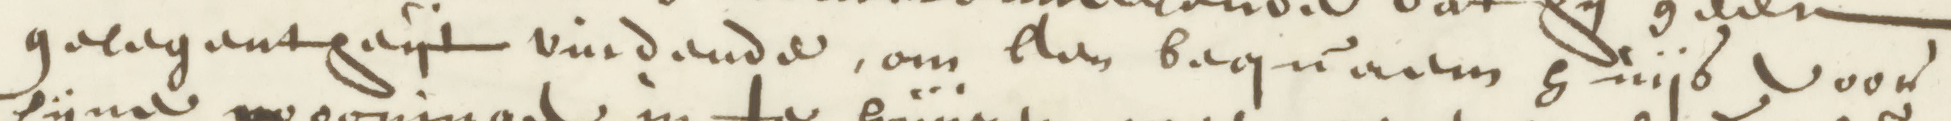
gelegentheijt vindende, om een bequaem huijs voor
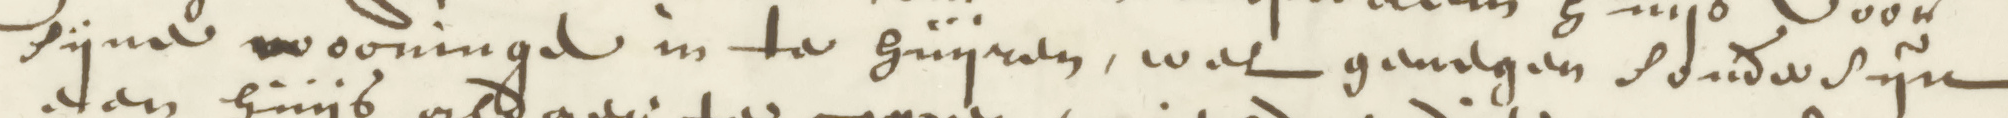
sijne wooninge in te huijren, wel genegen soude Sijn
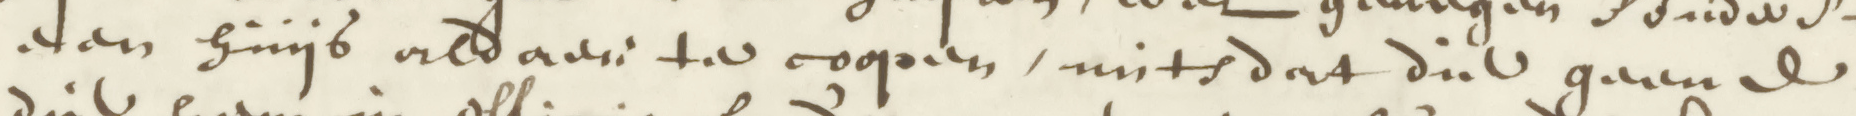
een huijs aldaer te coopen, mits dat die geene
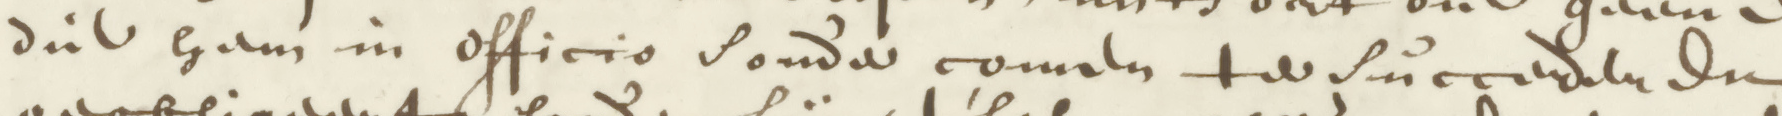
die hem in officio soude comen te succederen
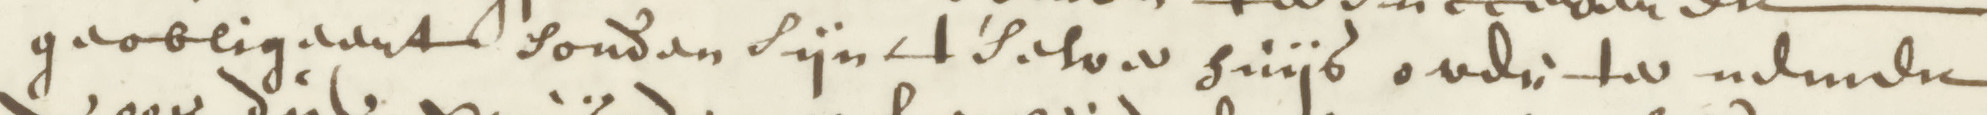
geobligeert souden sijn tselve huijs over te nemen
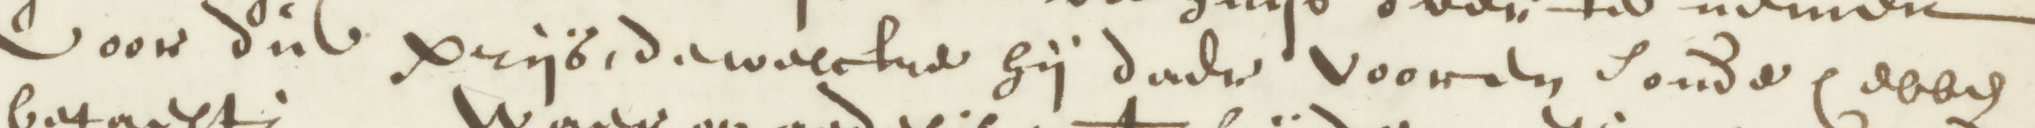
Voor die prijs, dewelcke hij daer vooren soude hebben
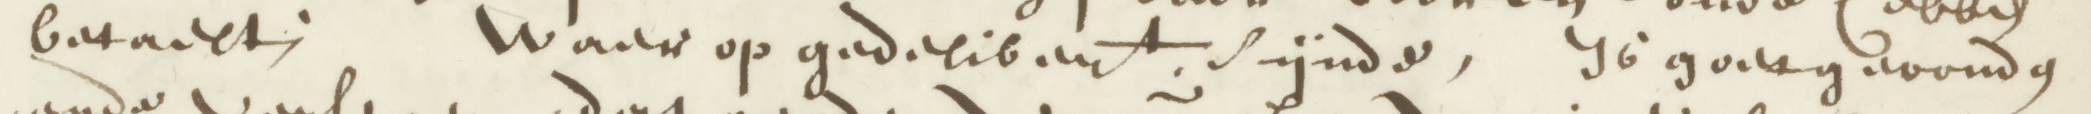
betaelt; Waerop gedelibert. sijnde, is goetgevonden
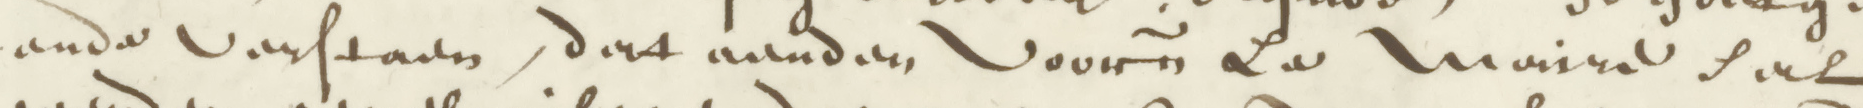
ende verstaen, dat aenden voorn Le Maire sal
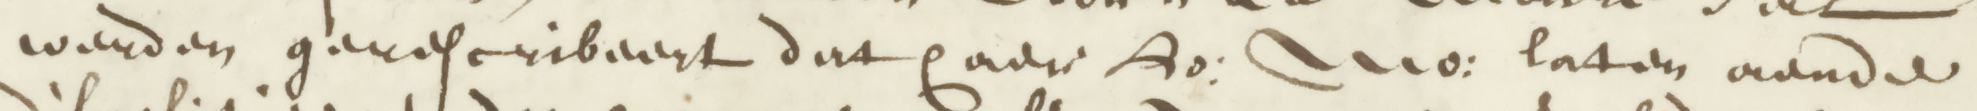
werden gerescribeert dat haer Ho:Mo: laten aende
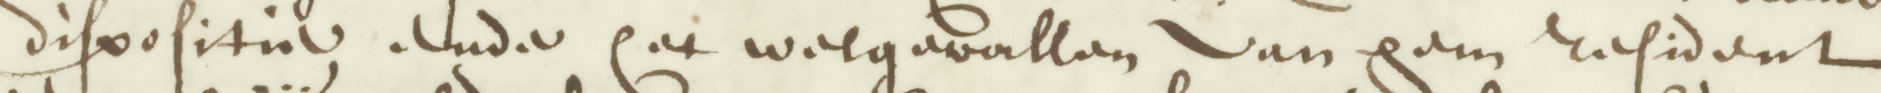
dispositie ende het welgevallen van hem resident
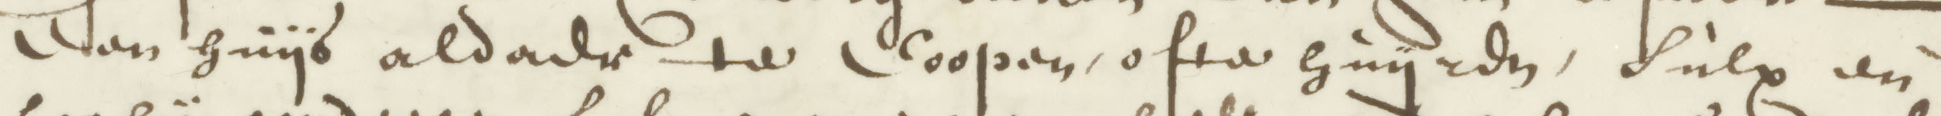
een huijs aldaer te coopen, ofte huijren, sulx en
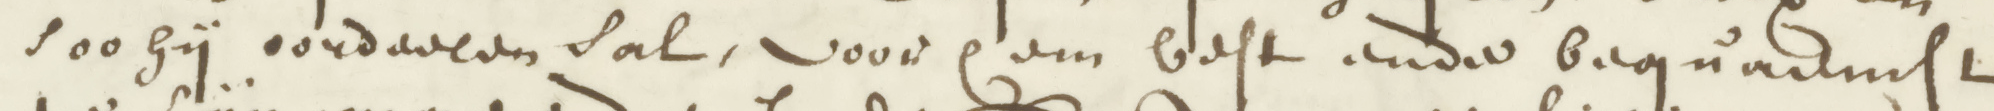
soo hij oordeelen sal, voor hem best ende bequaemst
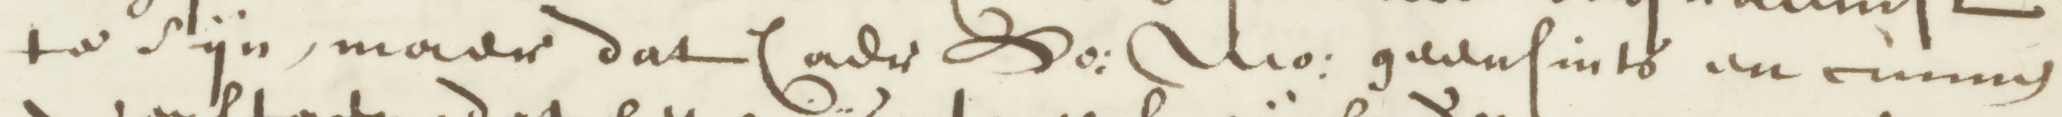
te sijn, maer dat haer Ho:Mo: geensints en cunnen
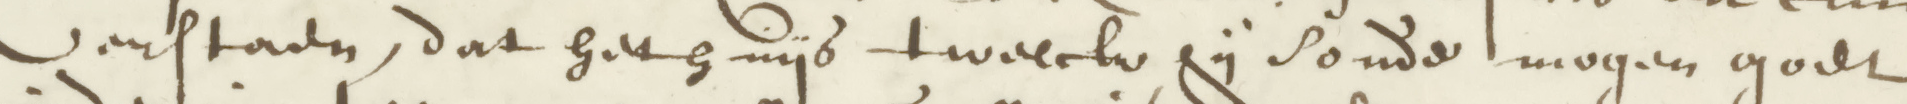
verstaen, dat het huijs twelck hij soude mogen goet
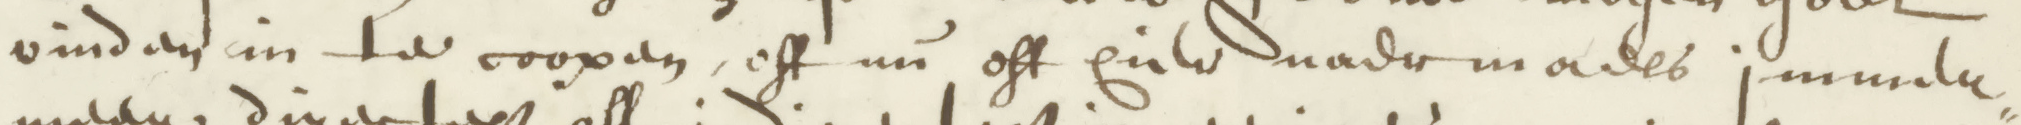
vinden in te coopen, oft nu oft hier naermaels immer„
